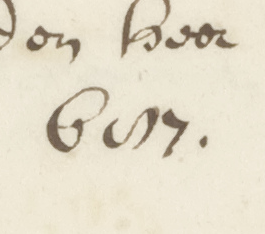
687.
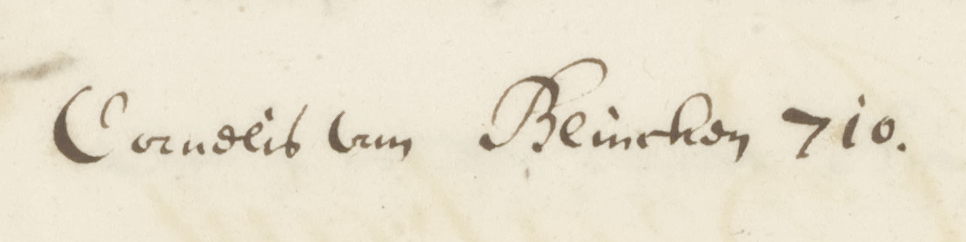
Cornelis van Blincken 710.
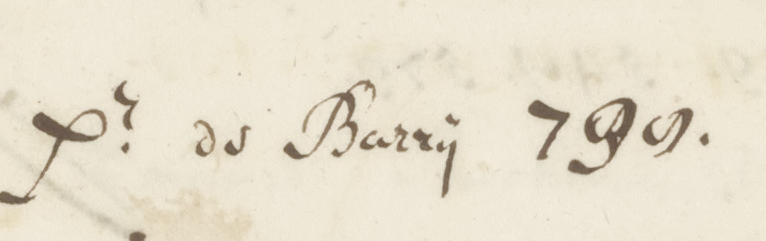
Pr. de Barrij 798.
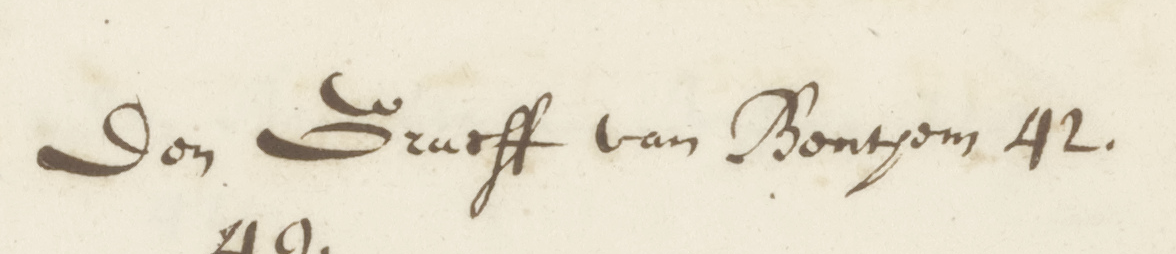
Den Graeff van Benthem 42.
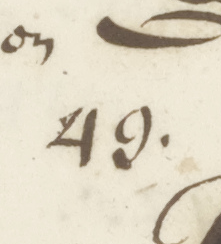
49.
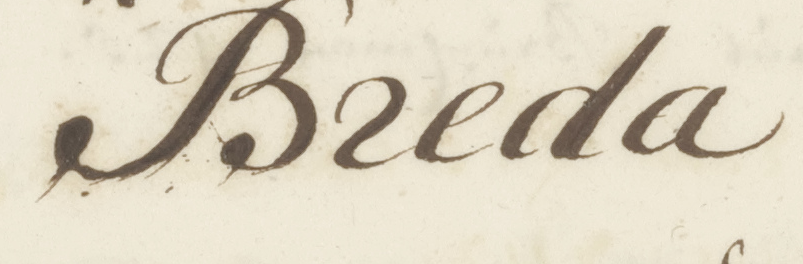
Breda
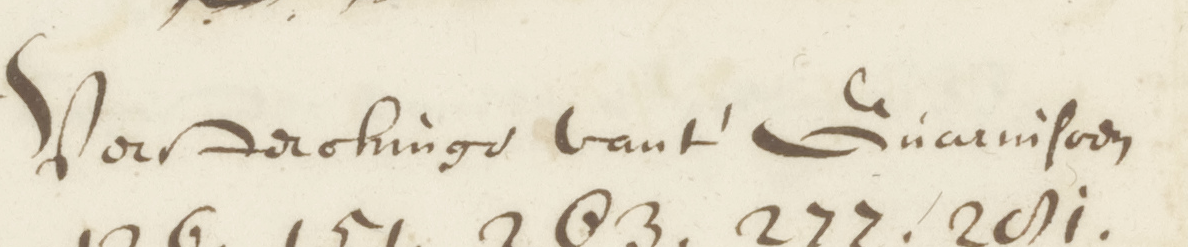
Versterckinge van t‛ Guarnisoen
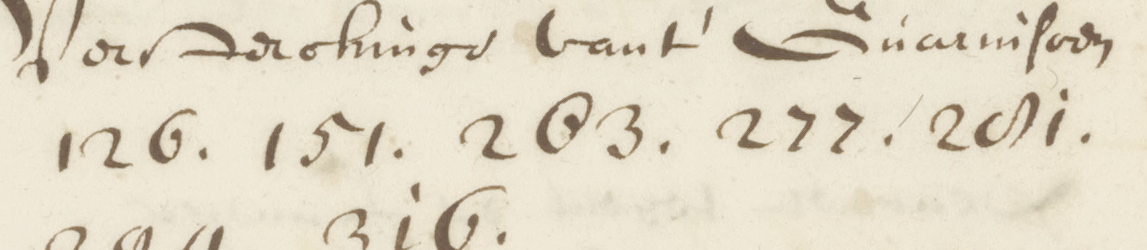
126, 151, 203, 277, 281,
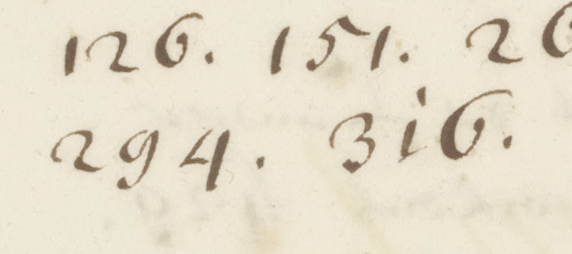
294, 316.
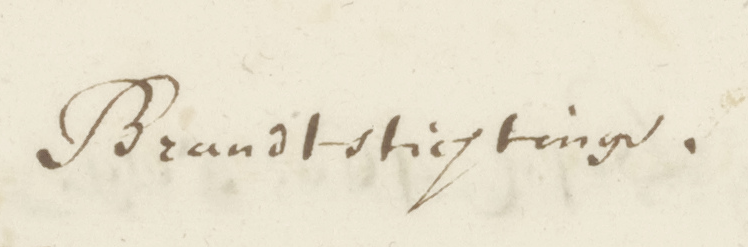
Brandtstichtinge.
